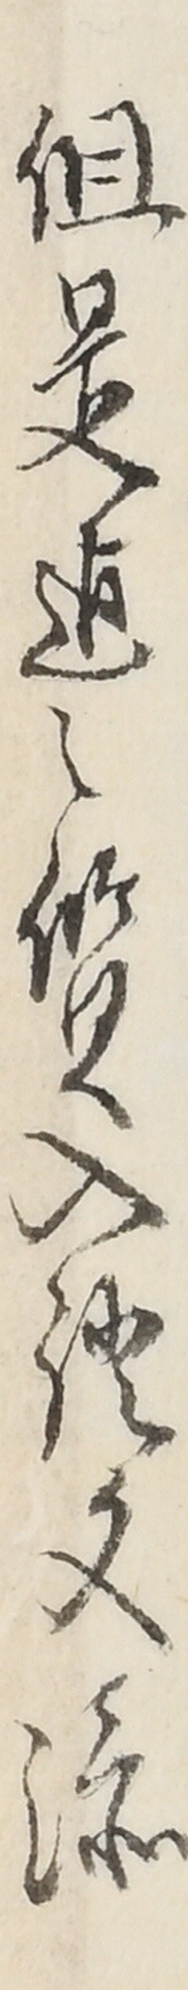但是迄之質入証文添

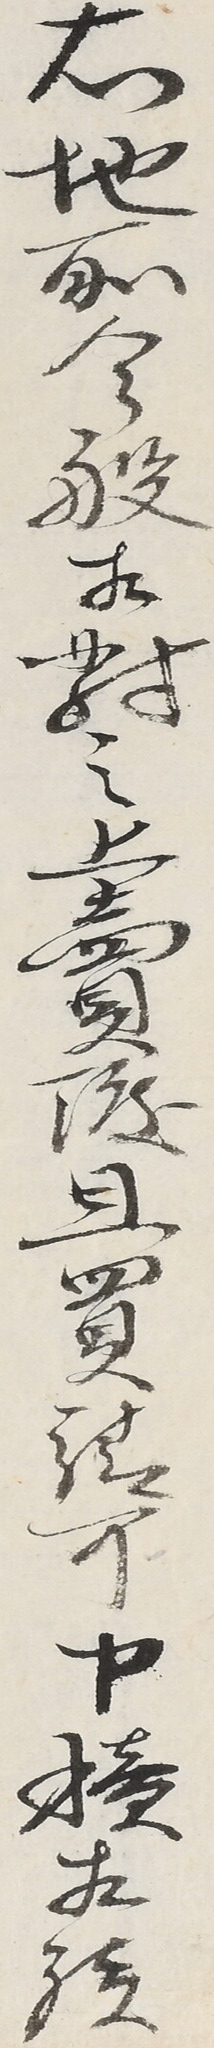右地所今般相対之上売渡且買請可申積相続
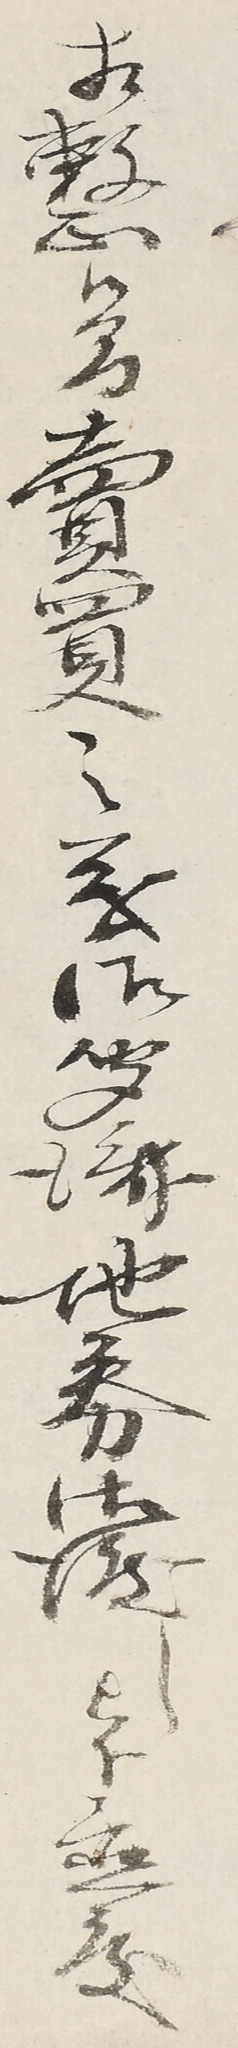相整候間売買之義御聞済地券御渡し被下置度
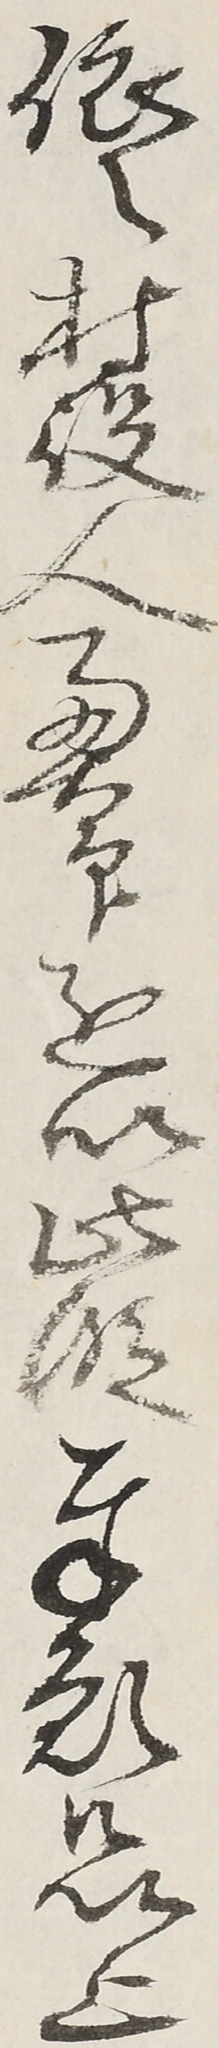依之村役人奥印を以此段奉願候以上
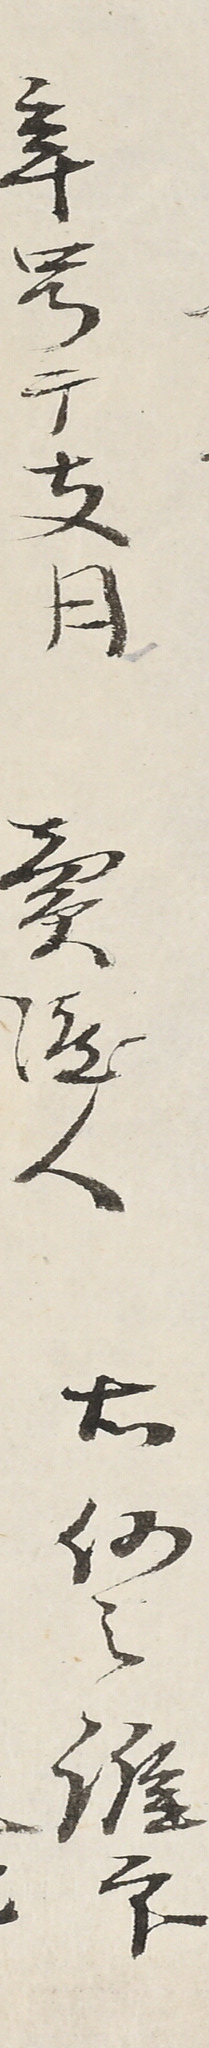年号干支月売渡人右何之誰印
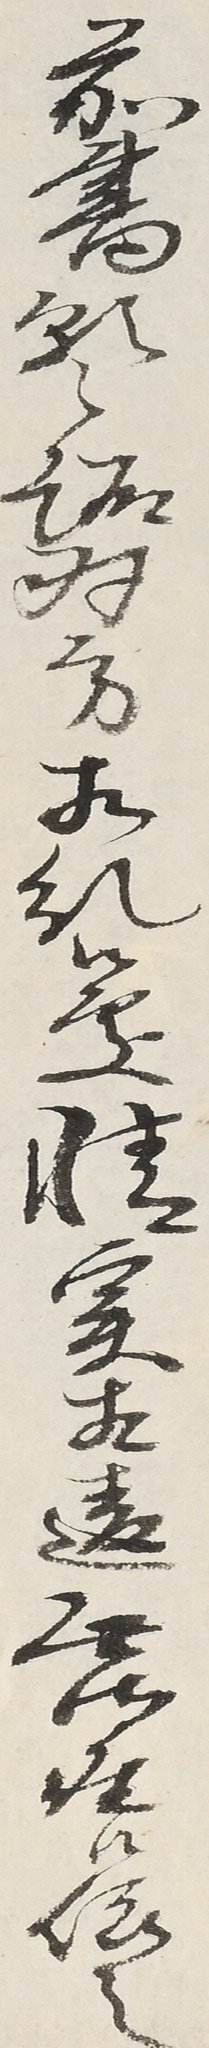前書願之趣双方相糺候処情実相違無御座候依之
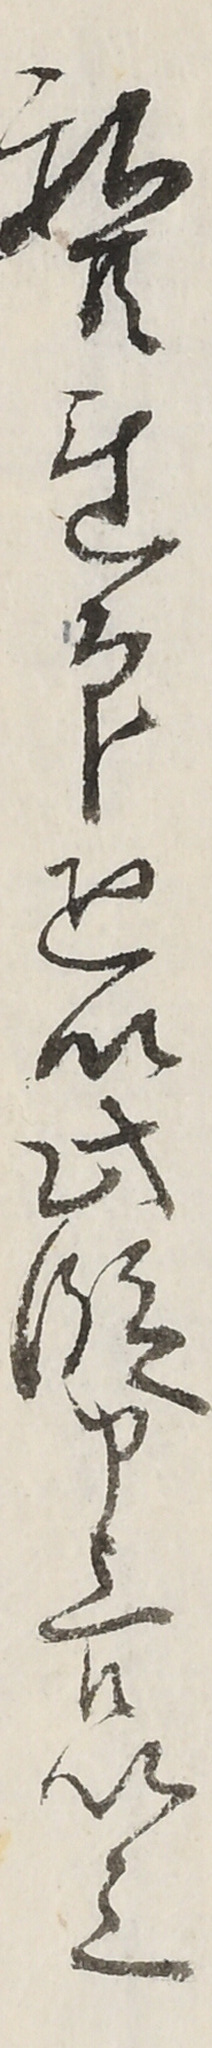私共連印を以此段申上候以上
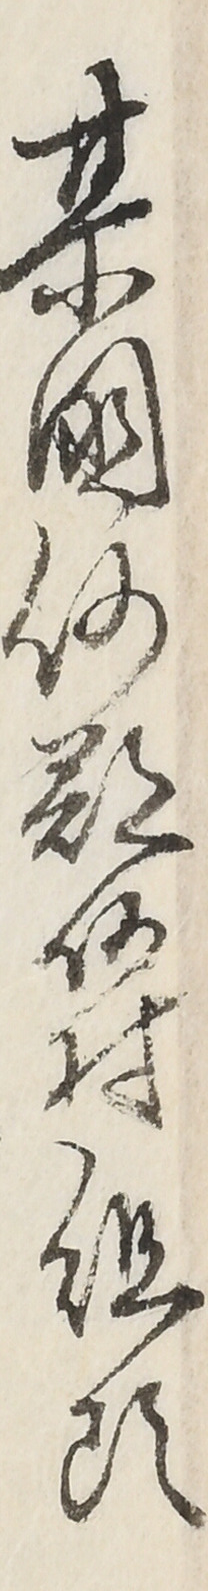某国何郡何村組頭
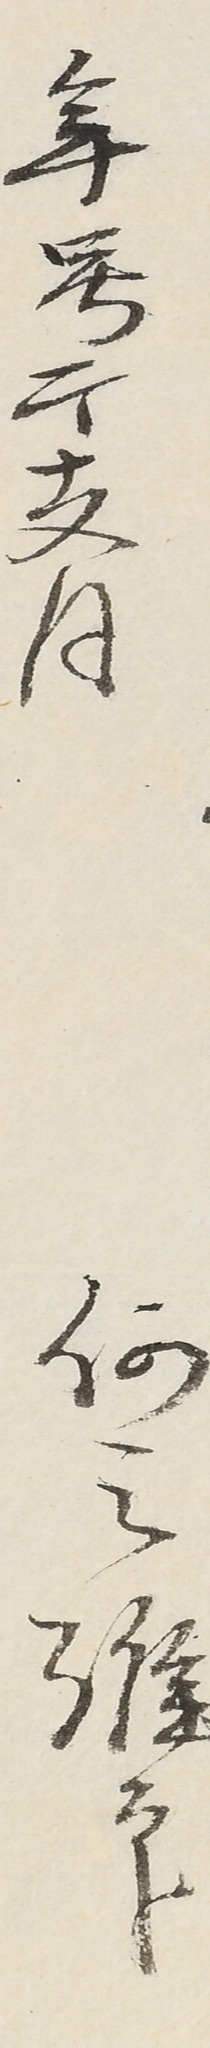年号干支月何之誰印
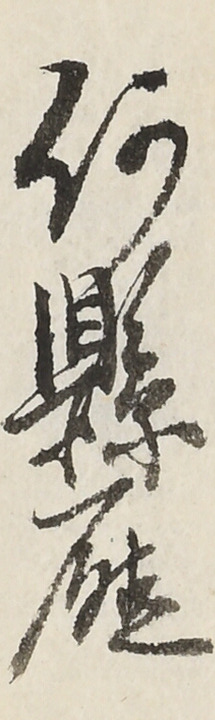何県庁
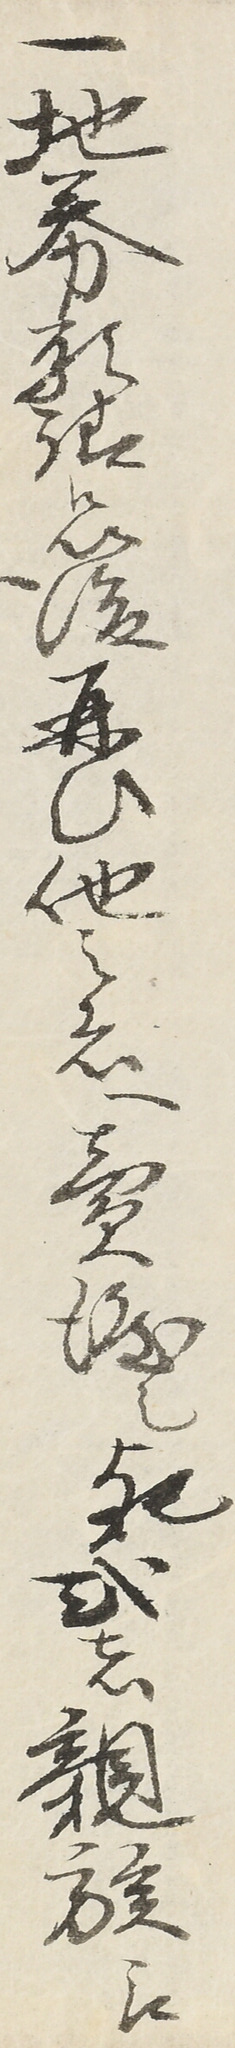一地券願請候以後再ひ他之者へ売渡シ欤或者親族江
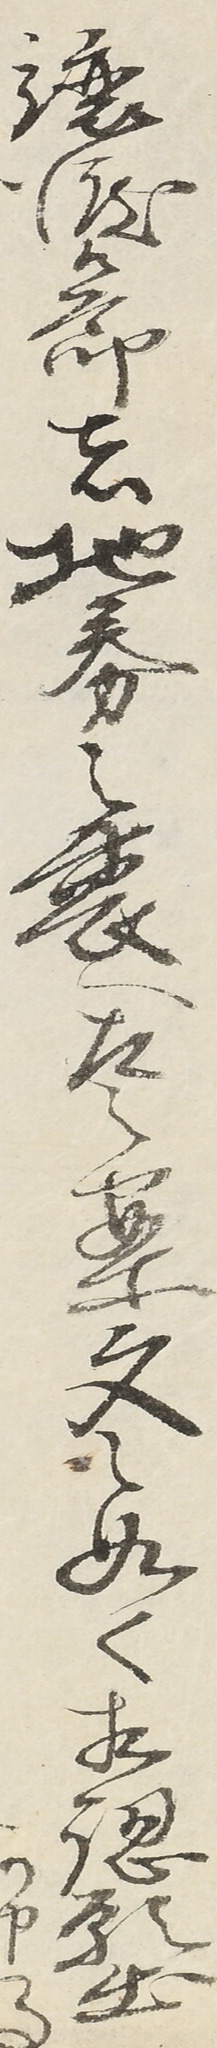譲渡候節者地券之裏へ左之案文之如く相認願出
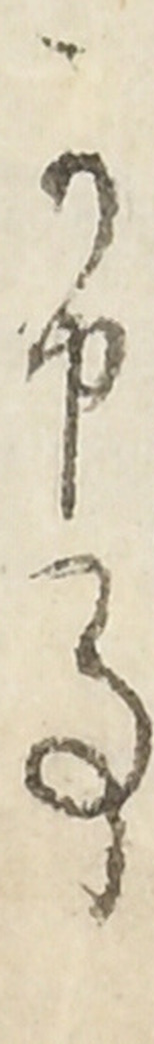可申事
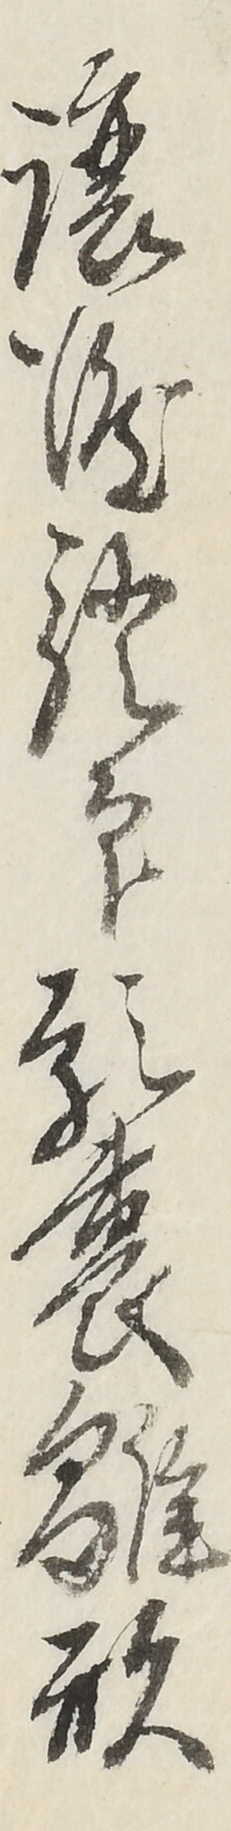譲渡証印願裏雛形
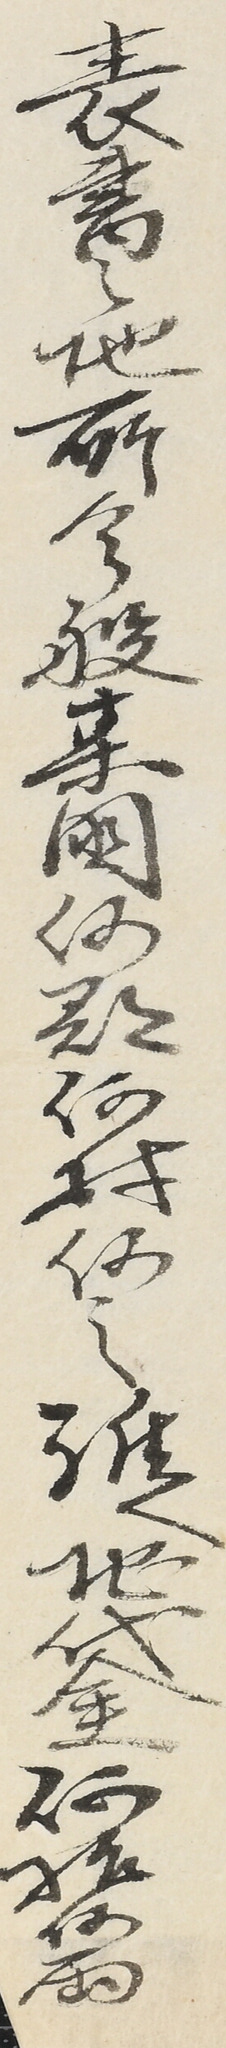表書之地所今般某国何郡何村何之誰へ地代金何拾何両

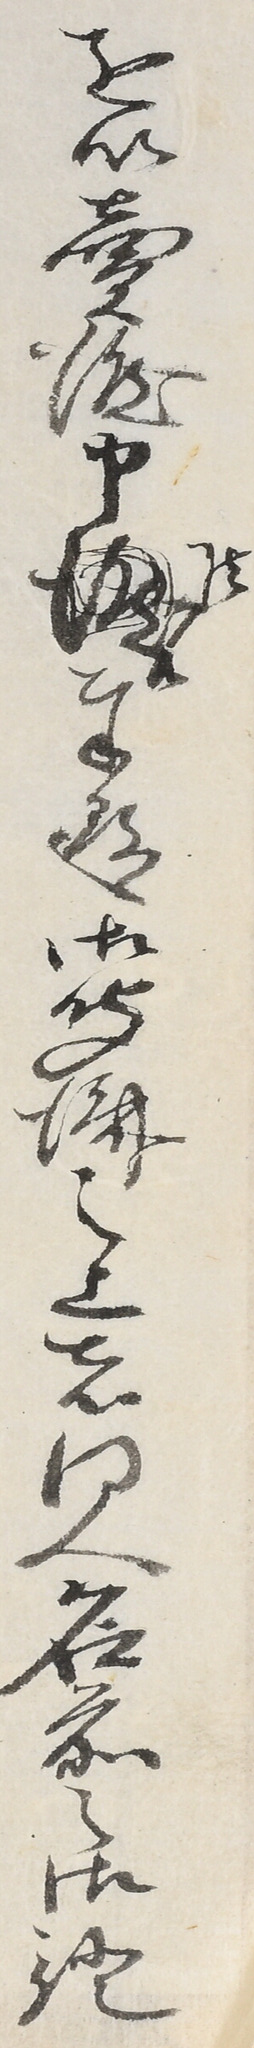を以売渡申渡奉存候御聞済之上者同人名前之御証
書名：廻状（控）
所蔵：伊那市立高遠町図書館・合同会社AMANE
